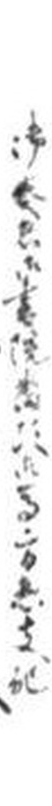御奏者御書院番頭御馬方惣支配
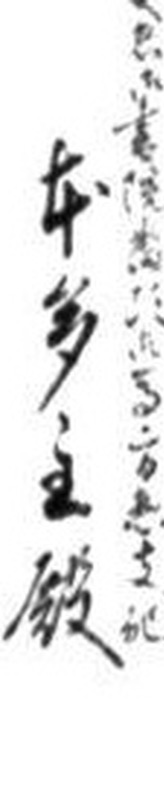本多主殿
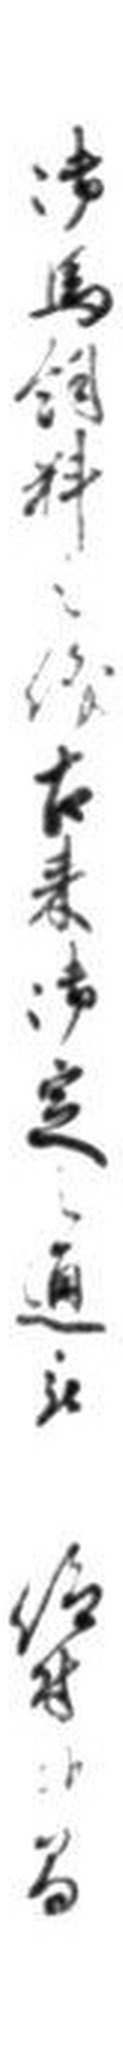御馬飼料之儀古来御定之通被仰付候間
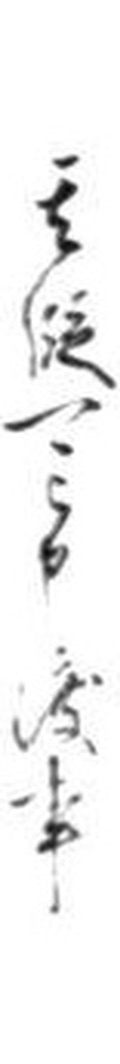其段可被申渡之事
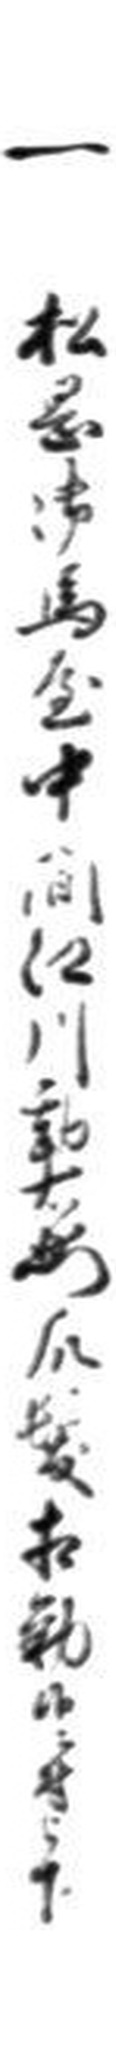一松岡御馬屋中間江川勘右衛門爪髪相勤候ニ付被下
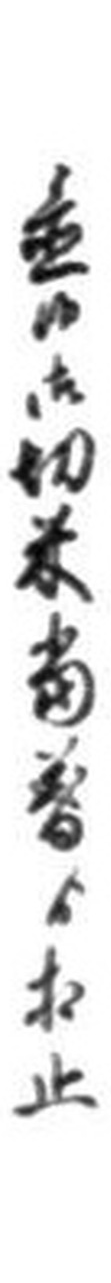置候御切米当暮ゟ相止
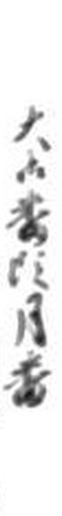大御番頭月番
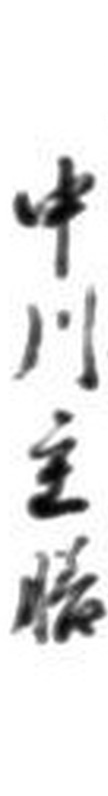中川主膳
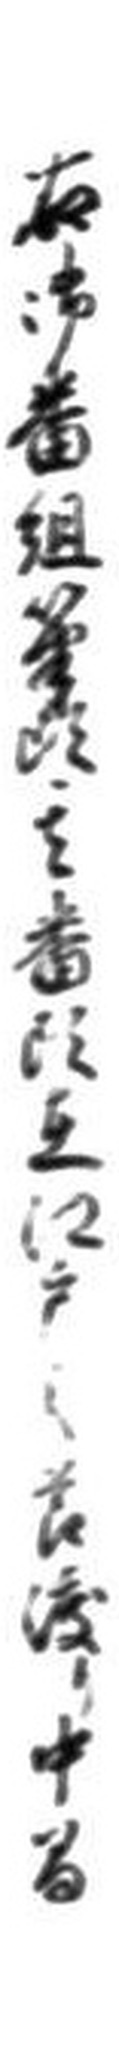右御番組筆頭其番頭在江戸之節渡り中間
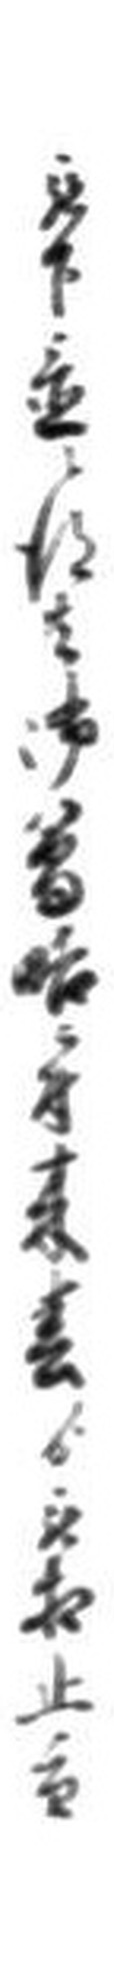被下置候得共御簡略ニ付来春ゟ被相止旨
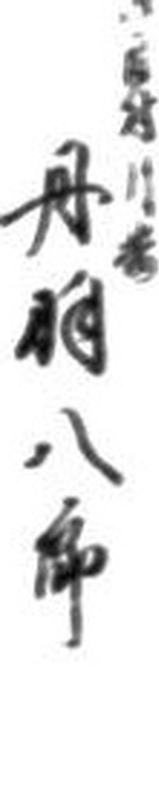丹羽八郎
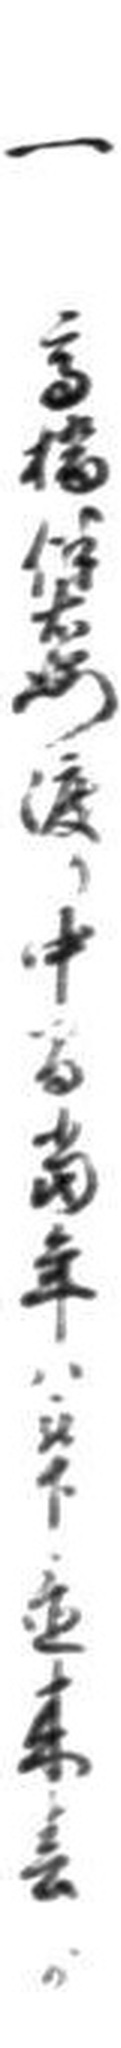一高橋伴右衛門渡り中間当年ハ被下置来春ゟ
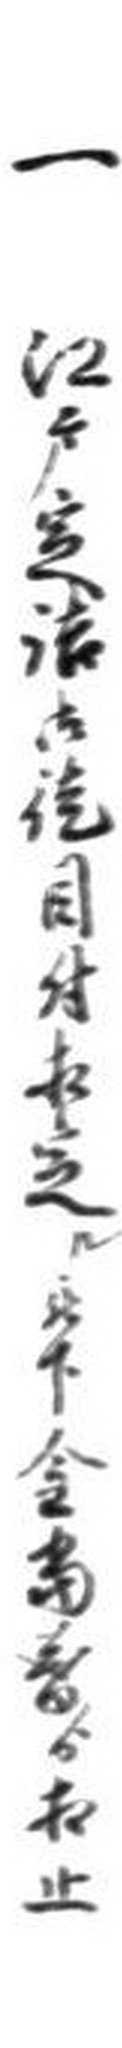一江戸常詰御徒目付相定ル被下金当暮ゟ相止

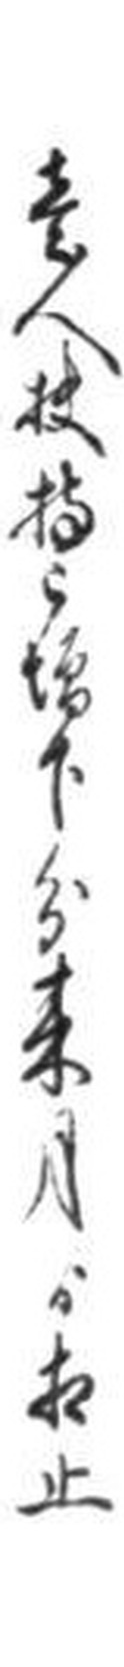壱人扶持被増下分来月ゟ相止
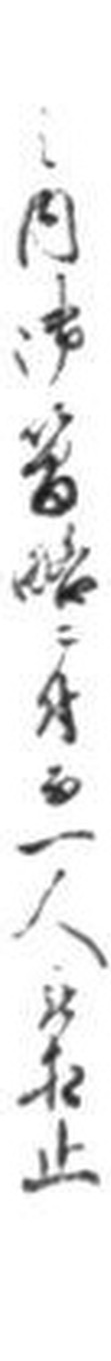之内御簡略ニ付而一人被相止
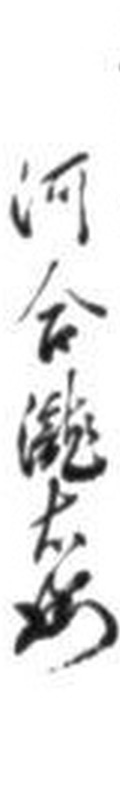河合瀧右衛門
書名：家譜 三十六 宗昌公 従享保八年到同九年
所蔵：福井県文書館 Fukui Prefectural Archives
